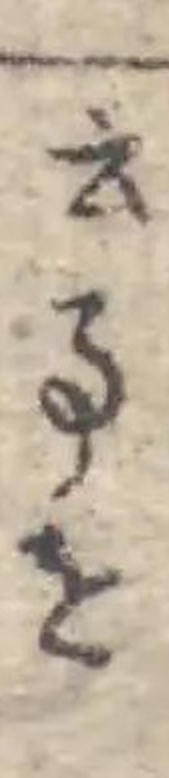云事を
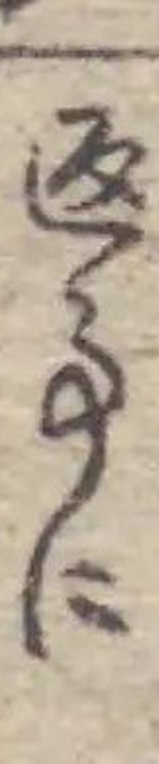返事に
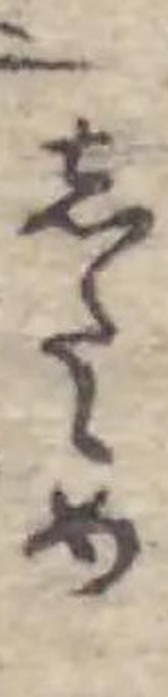したゝめ
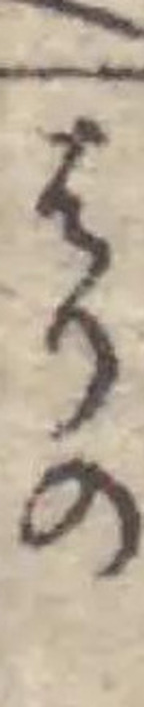はりの
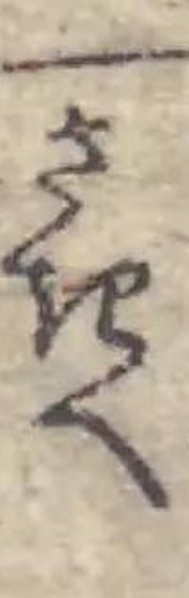さきへ
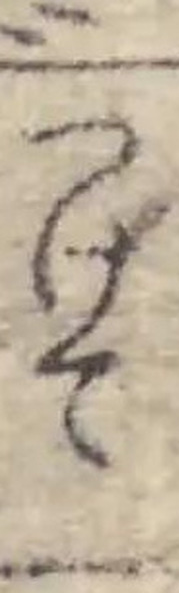つけて
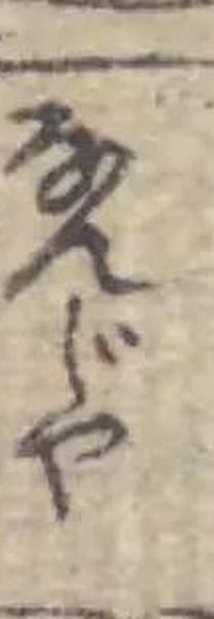なんじや
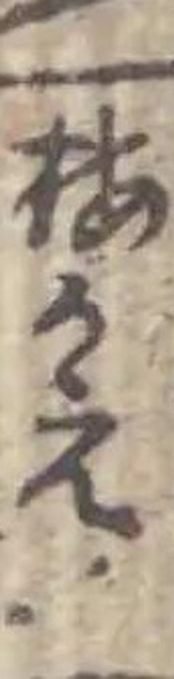梅かえ
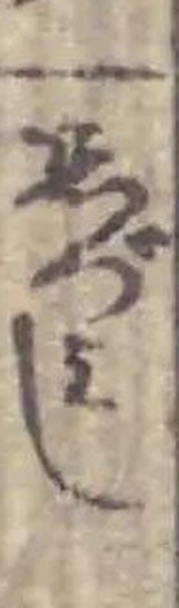しづみし
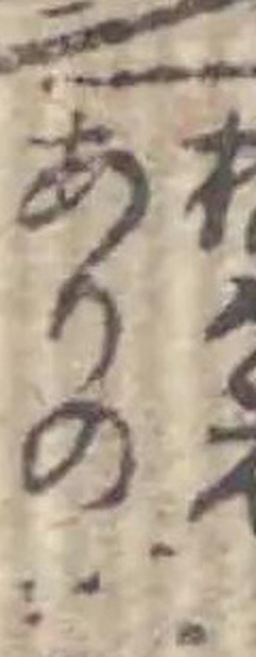ありの
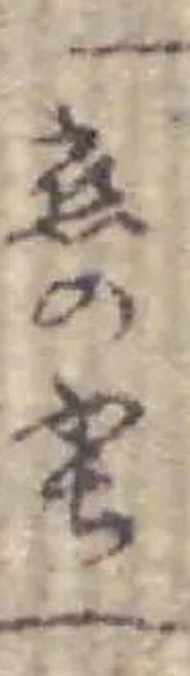恋のふち
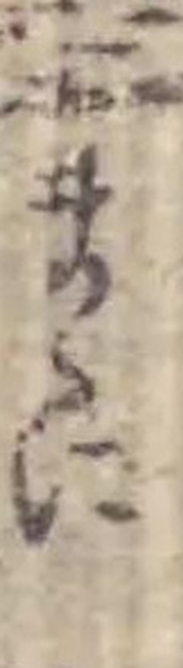まゝに
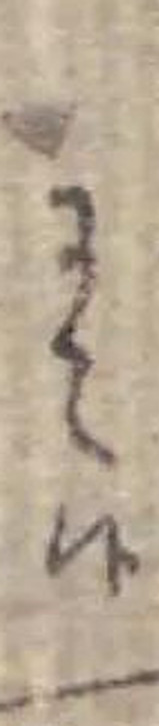にて候
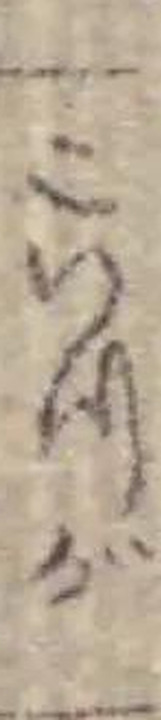こいつが
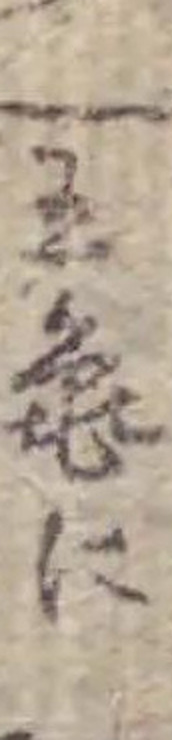王亀に
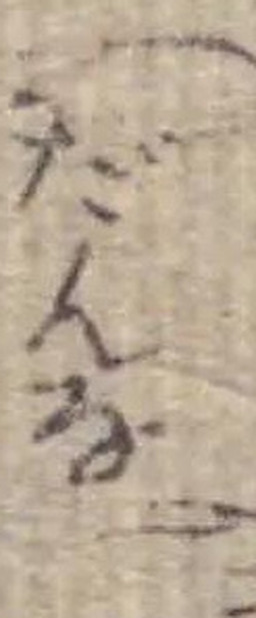だんな
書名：見立蓬莱 : 2巻
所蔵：国立国会図書館 National Diet Library, JAPAN
